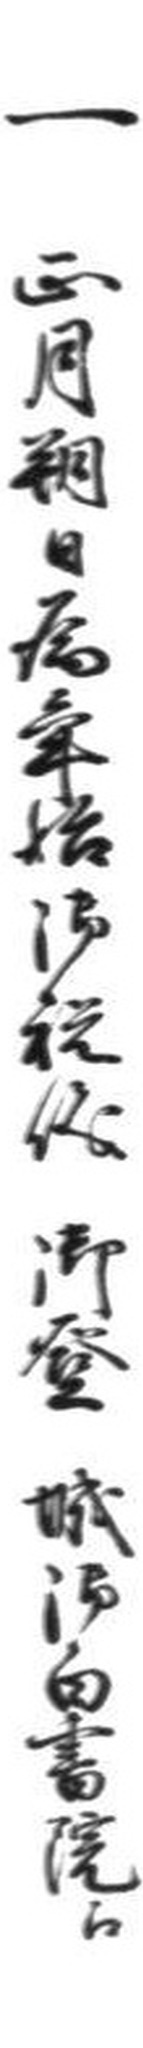一正月朔日為年始御祝儀御登城御白書院江
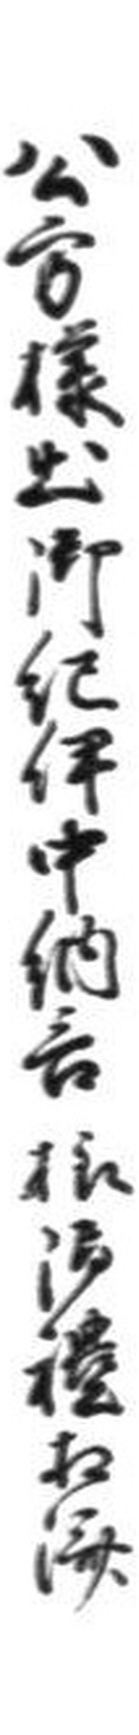公方様出御紀伊中納言様御礼相済
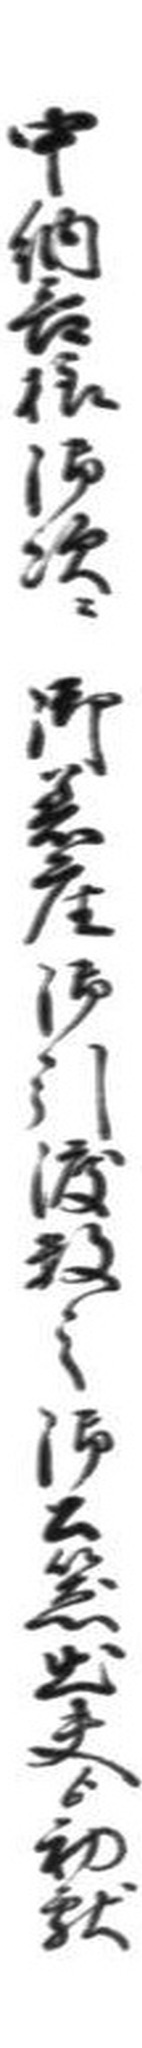中納言様御次ニ御着座御引渡数之御土器出夫ゟ初献
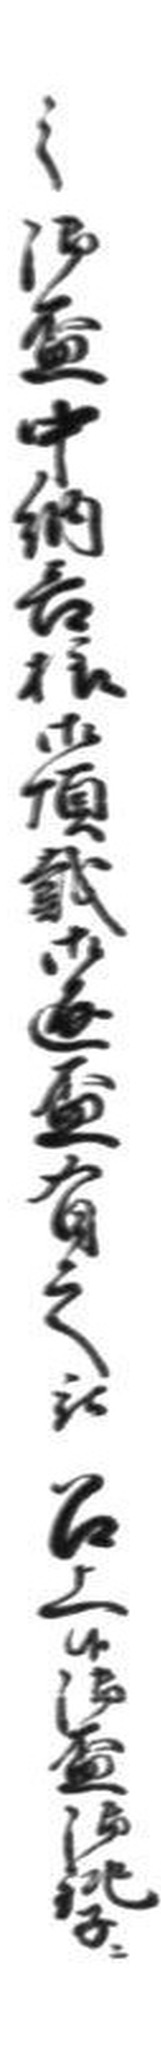之御盃中納言様御頂戴御返盃有之被召上候御盃御銚子ニ
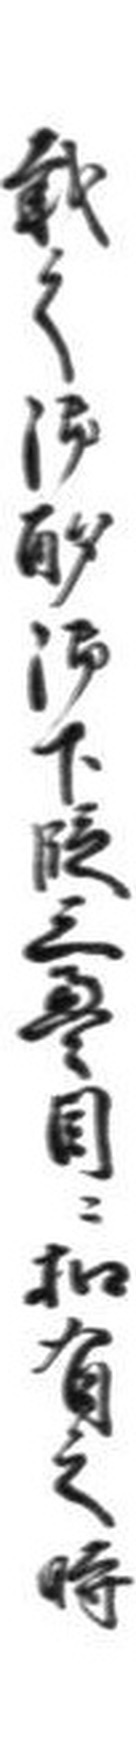戴之御酌御下段三畳目ニ扣有之時
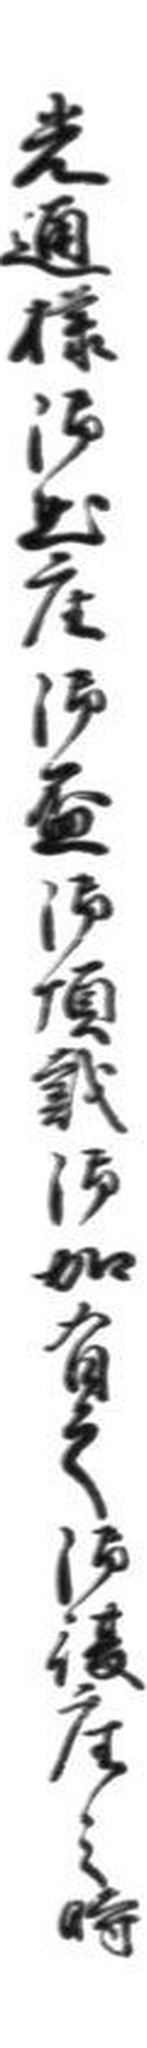光通様御出座御盃御頂戴御加有之御復座之時

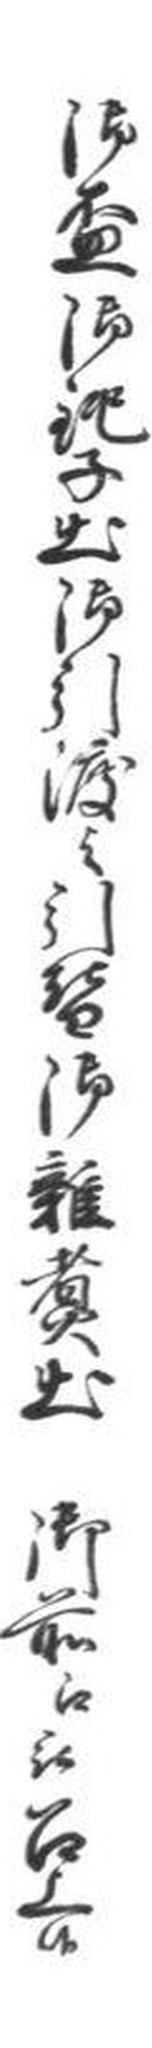御盃御銚子出御引渡と引替御雑煮出御前江被召上候
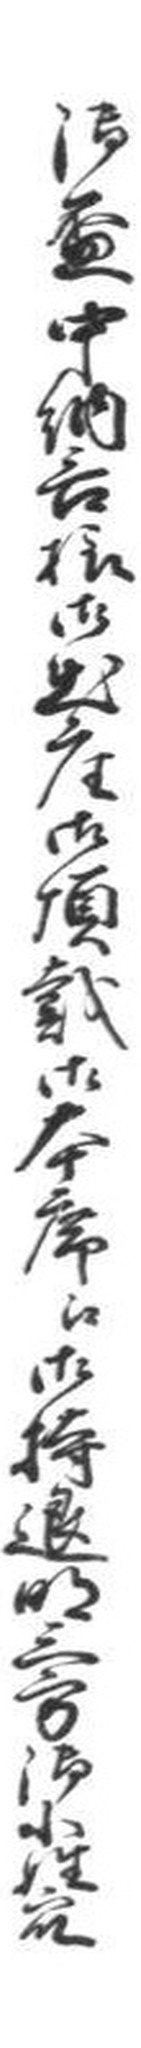御盃中納言様御出座御頂戴御本席江御持退明三方御小姓衆
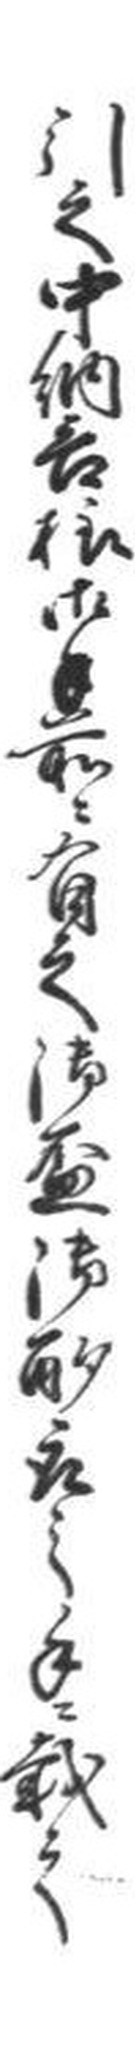引之中納言様御手前ニ有之御盃御酌取之手ニ載之
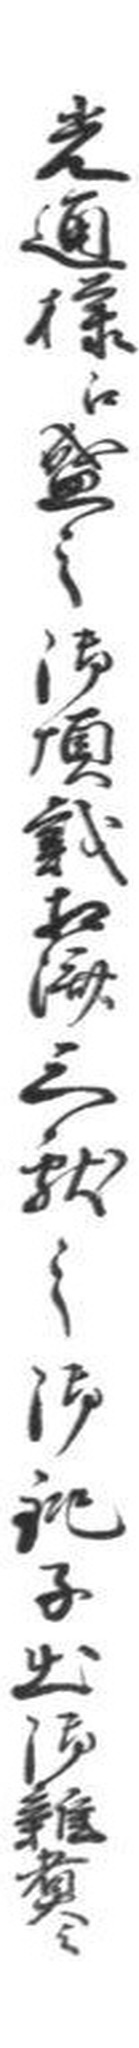光通様江盛之御頂戴相済三献之御銚子出御雑煮と
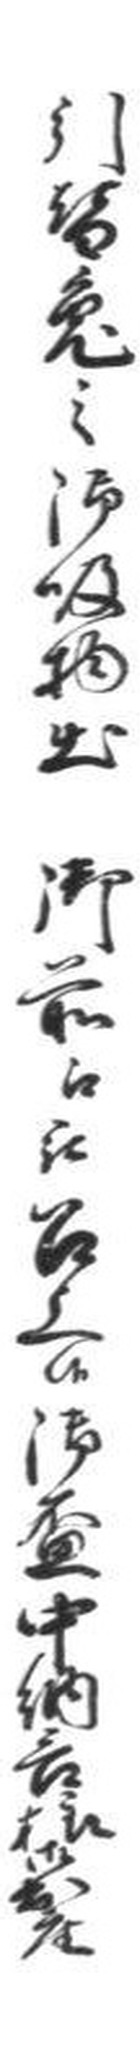引替兎之御吸物出御前江被召上候御盃中納言様御出座
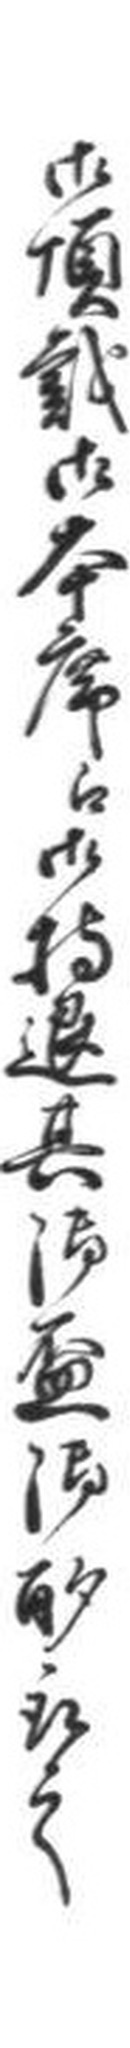御頂戴御本席江御持退其御盃御酌取之
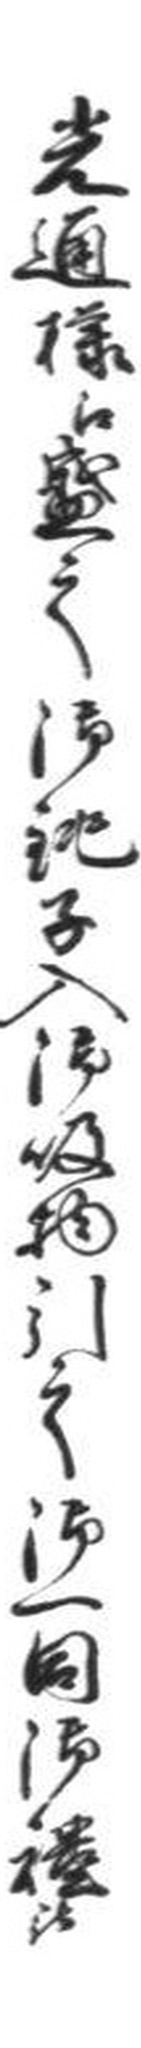光通様江盛之御銚子入御吸物引之御一同御礼被
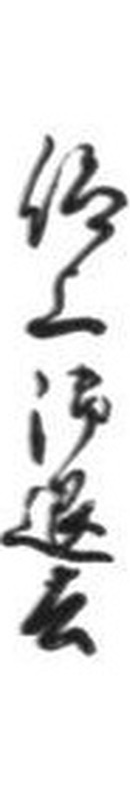仰上御退去
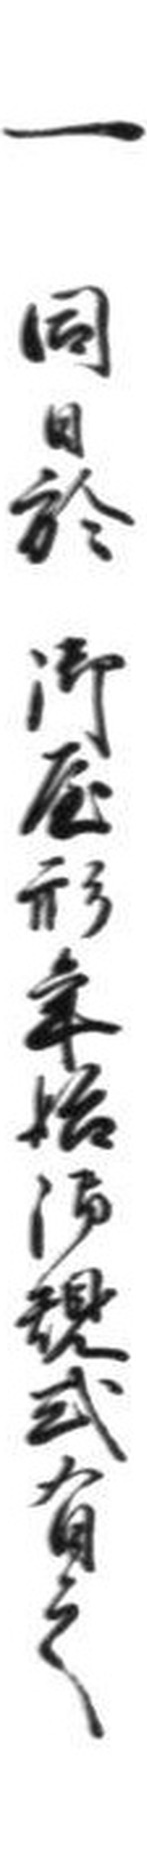一同日於御屋形年始御規式有之
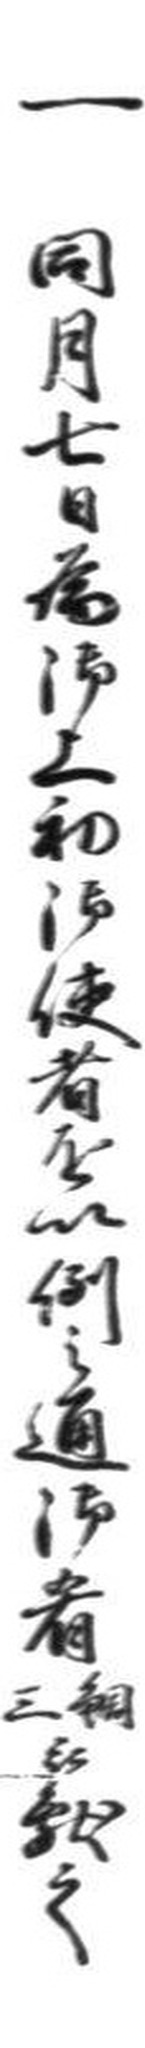一同月七日為御上初御使者を以例之通御肴鯛三被献之
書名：家譜 八 光通公 従寛文十年到同十二年
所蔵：福井県文書館 Fukui Prefectural Archives
